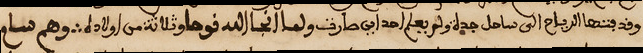وقدفتها الرياح الى ساحل جدة يعلم احد اين صارت ولما انجا الله نوحا وثلاثة من اولاده وهم سام
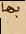بها
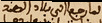لما رجعا الى بلاد الهند
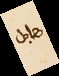هابل
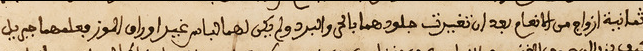ثمانية ازواج من الانعام بعد ان تغيرت جلودهما بالحر والبرد ولم يكن لهما الباس غير اوراق الموز فعلمهما جبريل
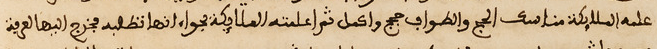علمه الملائكة مناسك الحج والطواف فحج واكمل ثم اعلمته الملائكة بحواء انها تطلبه فخرج اليها العرفة
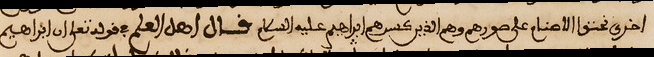اخرى نختوا الاصنام على صورهم وهو الذين كسرهم ابراهيم عليه السلام قال اهل العلم في قوله تعلى ان ابراهيم
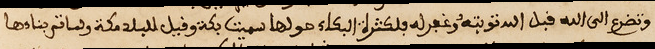وتضرع الى الله قبل الله توبته وغفر له فلكثرة البكاء حولها سميت بكة وقيل للبلد مكة ولما تم بناءها
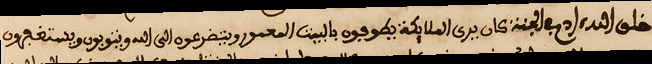خلق الله ءادم في الجنة كان يرى الملائكة يطوفون بالبيت المعمور ويتضرعون الى الله ويتوبون ويستغفرون
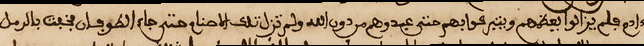ءادم فلم يزالوا يعظمهم ويتبر كوا بهم حتى عبدوهم من دون الله ولم تزل تلك الاصنام حتى جاء الطوفان فجفت بالرمل
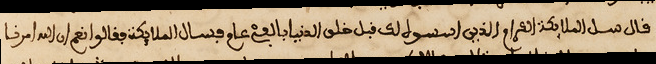قال سل الملائكة الكرام الذين اسسوه لك قبل خلف الدنيا بافى عام فسال الملائكة فقالوا نعم الله امرنا
